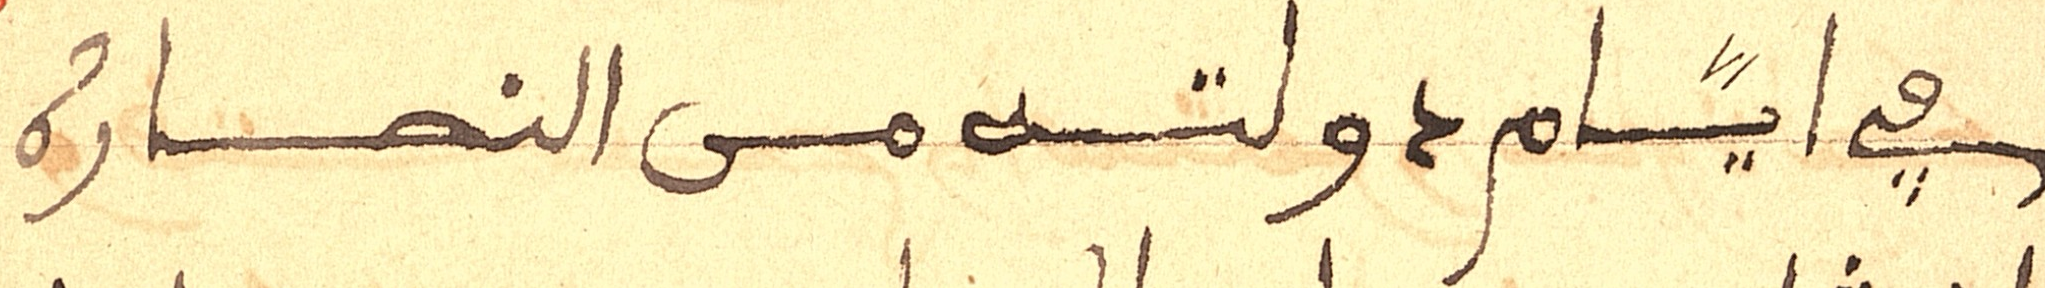في يام دولته من النصاره
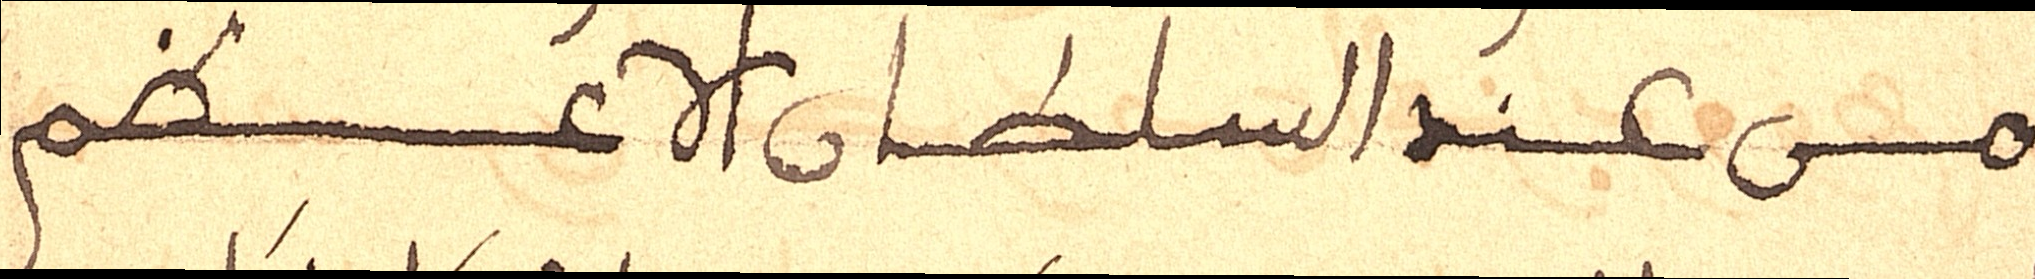من عند الساطان الاعظم
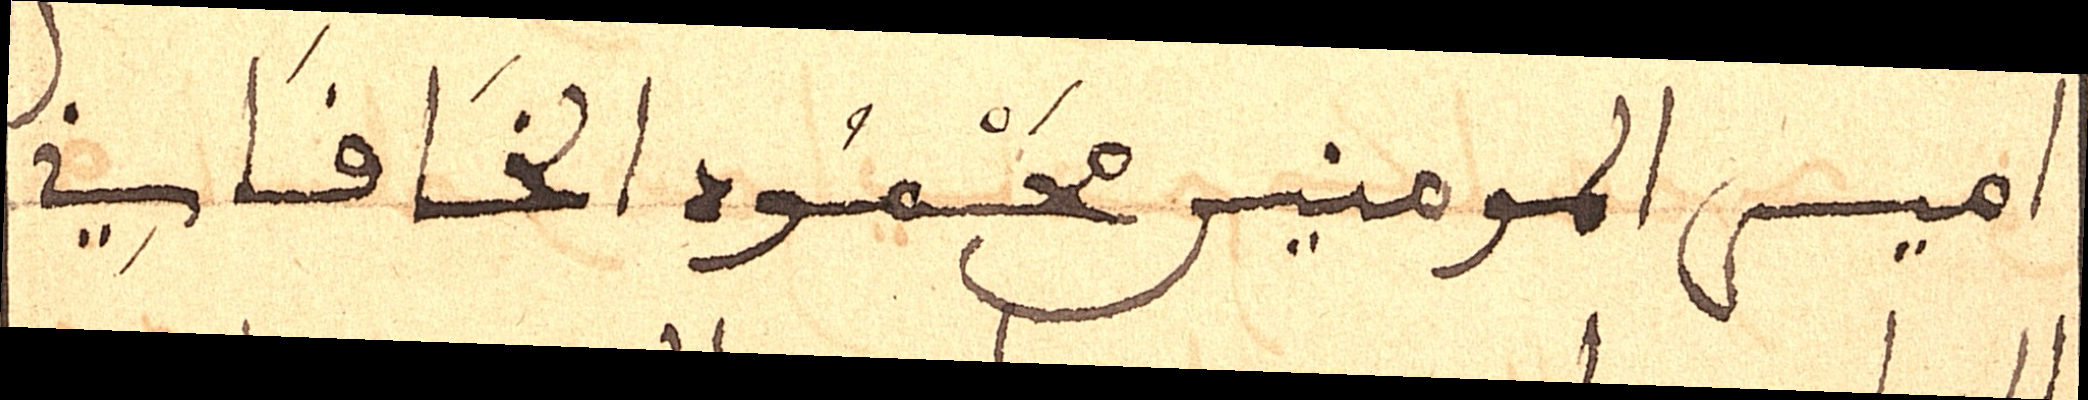امير المومنين محمود الخاقاني
